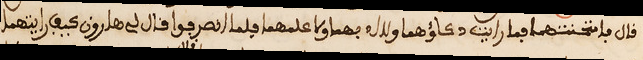قال فامتحنتهما فما رايت دكاؤهما ولا ادبهما ولا علمهما فلما انصرفوا قال لى هارون كيف رايتهما
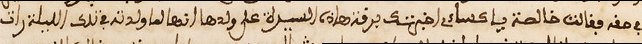في حقه فقالت خالصة با كساءى اخبرتك برقة هاذه السيدة على ولدته في تلك الليلة رات
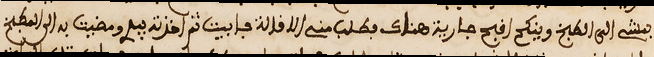يمشى الى الطبج ينكح اقبح جارية هناك فطلب منى الاقالة فابيت ثم اخذته بيدى ومضيت به الى المطبج
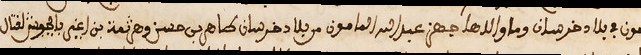مون في بلاد خرسان وما ولاها جهز عبد الله المامون من بلاد خراسان طاهر بن حسن وهرثمة بن اعين بالجيوش لقتال
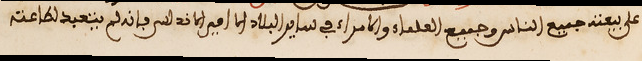على بيعته جميع الناس وجميع العلماء والامراء في ساير البلاد الامير الاندلس فانه لم يتعبد الطاعته
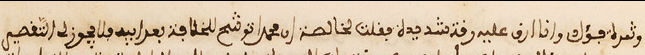وثمرة فؤك وانا ارق عليه رقة شديدة فقلت الخاصة ان محمدا توشح بعد ابيه فلا يجوز لى التقصير
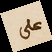على
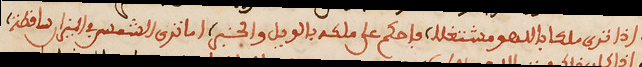اذا ترى ملكا باللهو مشتغلا فاحكم على ملكه بالويل والخبر ما ترى الشمس في الميزان ساقطة
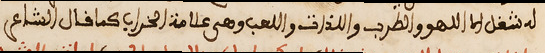له شغل الا اللهو والطرب واللذات واللعب وهى علامة الخراب كما قال الشاعر
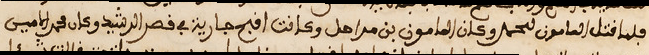فلما قتل المامون محمد وكان المامون بن مراحل وكانت اقبح جارية في قصر الرشيد وكان محمد الامين
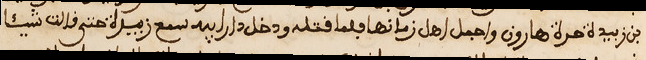بن زبيدة حرة هارون واجمل اهل زمانها فلما قتله ودخل دار ابيه سمع زبيدة حتى قالت شيئا
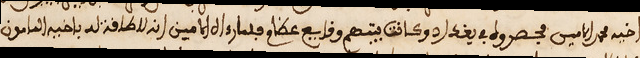اخيه محمد الامين فحصروه في بغداد وكانت بيتهم وقايع عظام فلما رءاه الامين انه لاطاقة له باخيه المامون
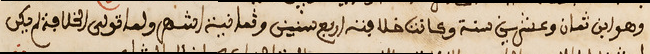وهو ابن ثمان وعشرين سنة وكانت خلافته اربع سنين وثمانية اشهر ولما تولى الخلافة لم يكن
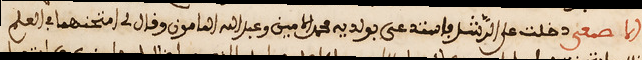الاصمعى دخلت على الرشد فاستدعى بولديه محمد الامين وعبد الله المامون وقال لى امتحنهما في العلم
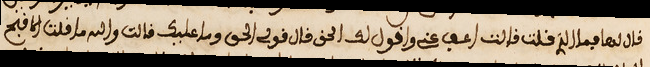قال لها فما الذي قلت قالت اعف عنى واقول لك الحق قال قولى الحق وما عليك قالب والله ما قلت الا قبح
